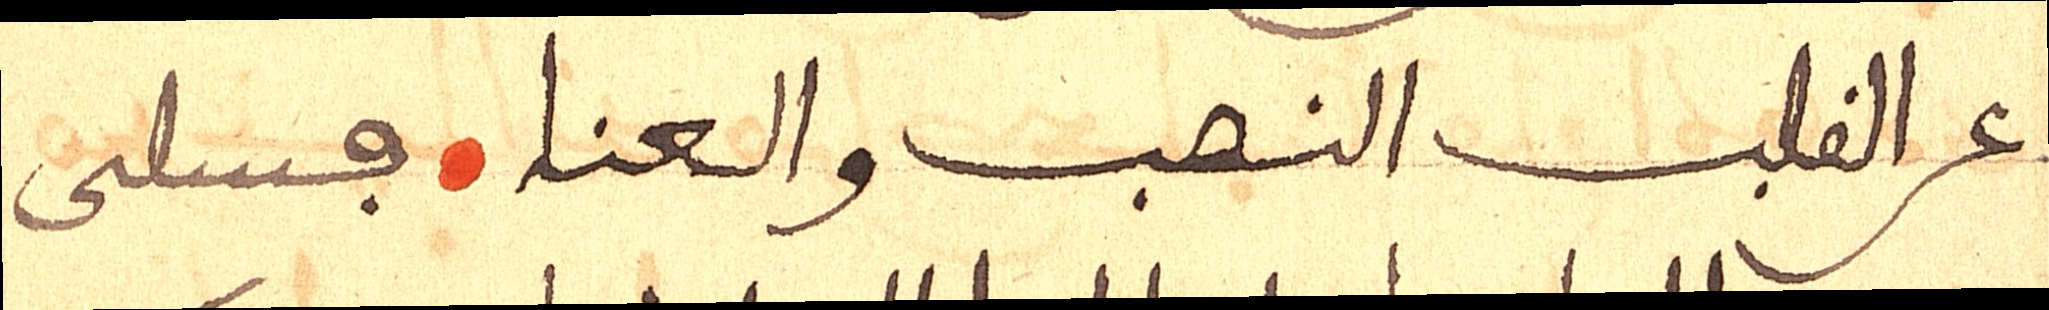عن القلب النصب والعنا فسلى
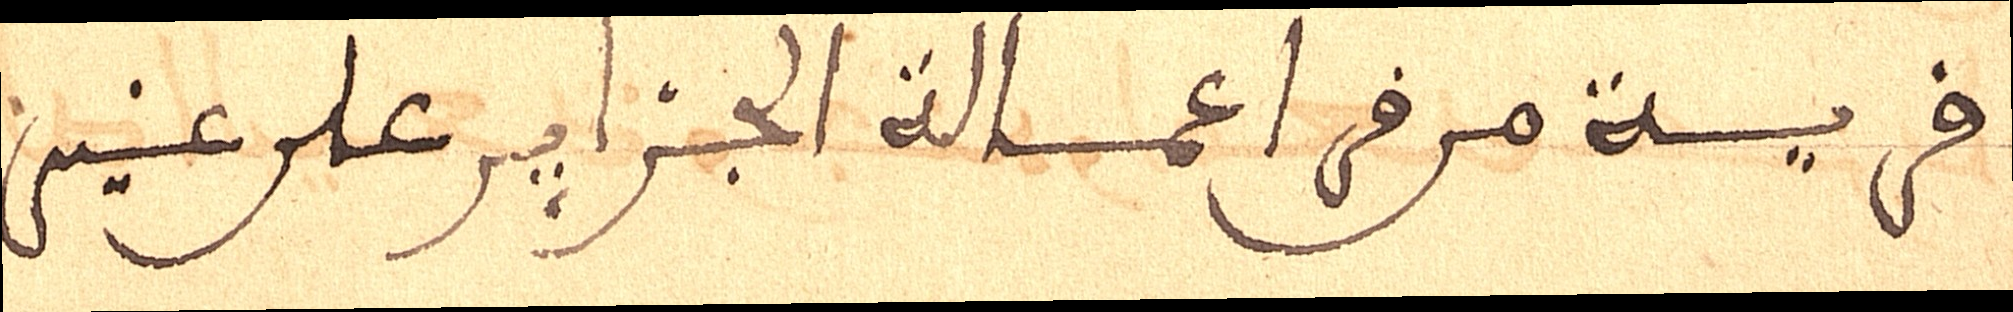قرية من قر اعمالة الجزائر على غير
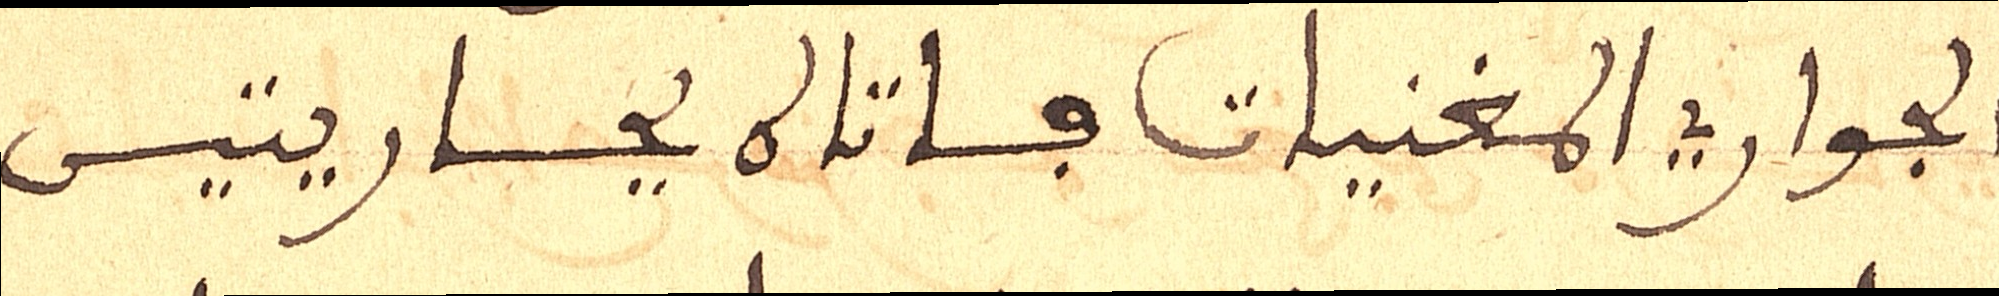الجواري المغنيات فاتاه يحاريتين
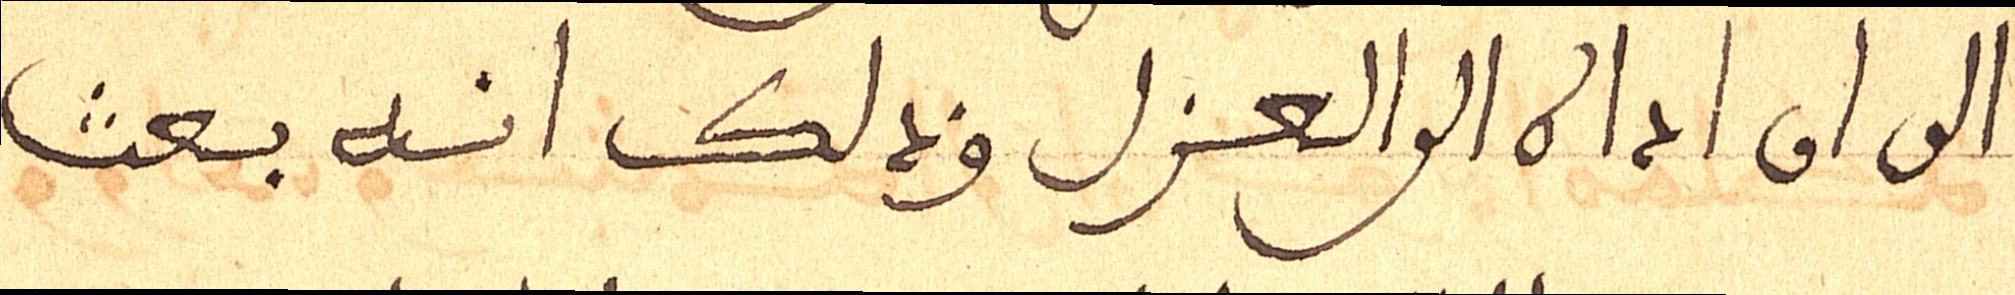الى ان اداه الى العزل وذلك انه بعث
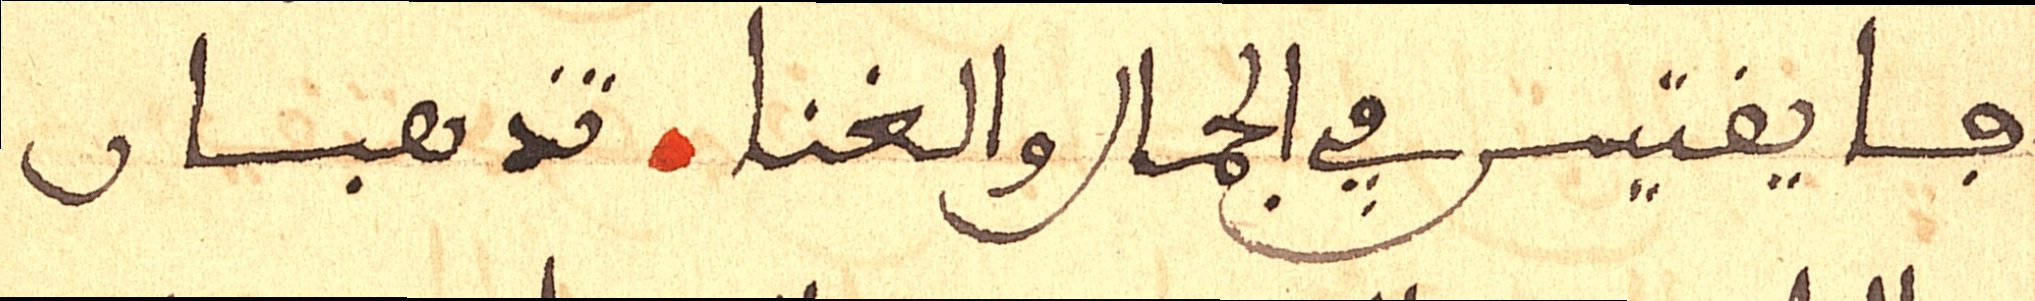فايقتين في الجمال والغنا تذهبان
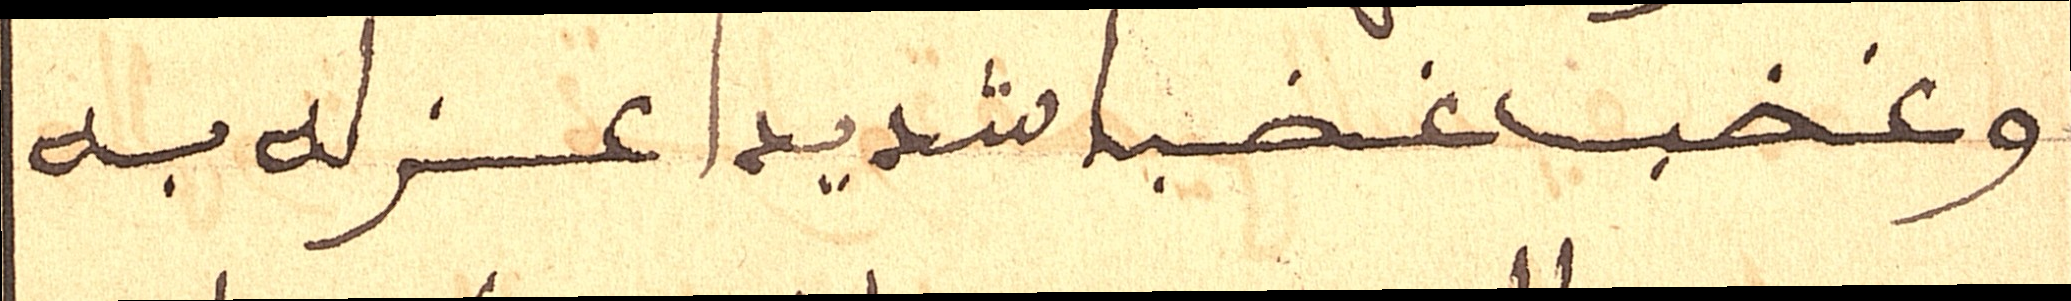وغضب غضبا شديد اعزله به
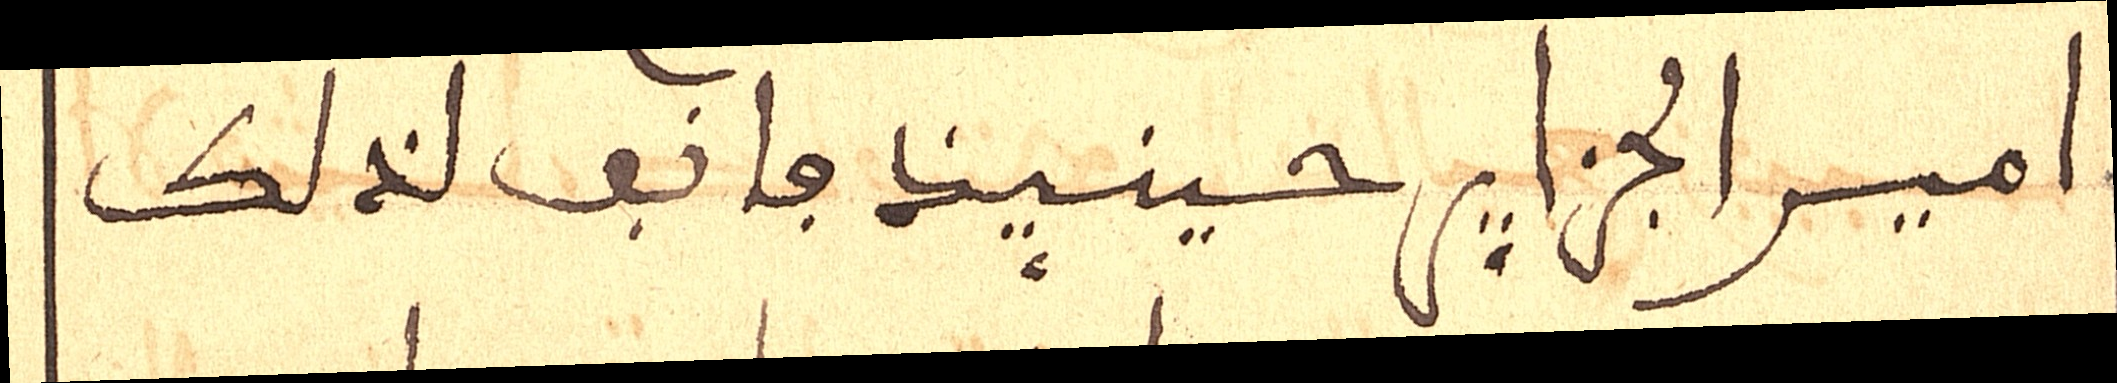امير الجزائر حينيذ فانف لذلك
